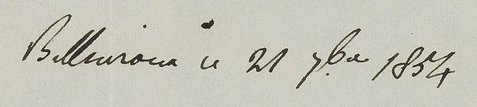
Bellinzona le 21 7bre 1854
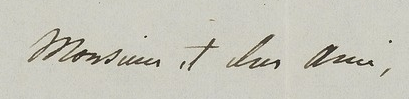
Monsieur et cher Ami,
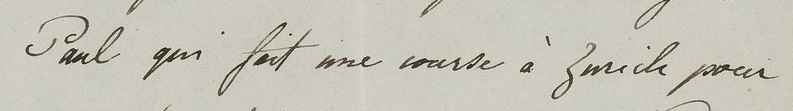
Paul qui fait une course à Zurich pour
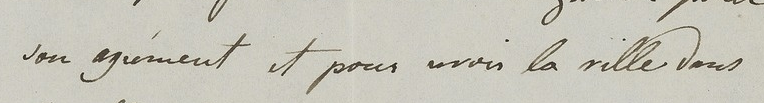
son agrément et pour revoir la ville dans
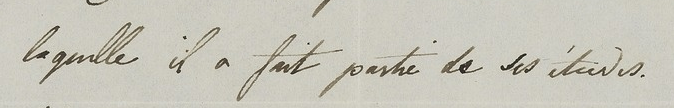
laquelle il a fait partie de ses études.
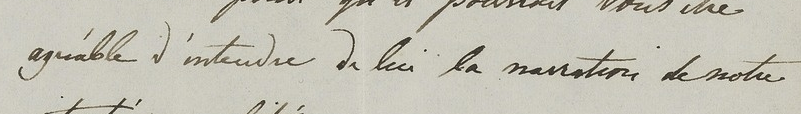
agréable d'entendre de lui la narration de notre
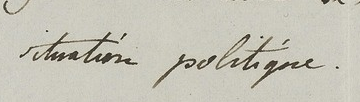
situation politique.
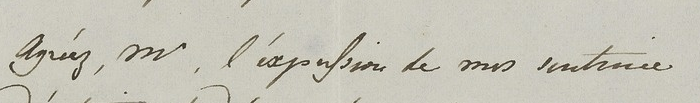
Agréez, Mr., l'expression de mes sentiments
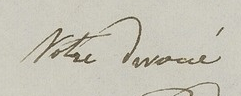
Votre dévoué
